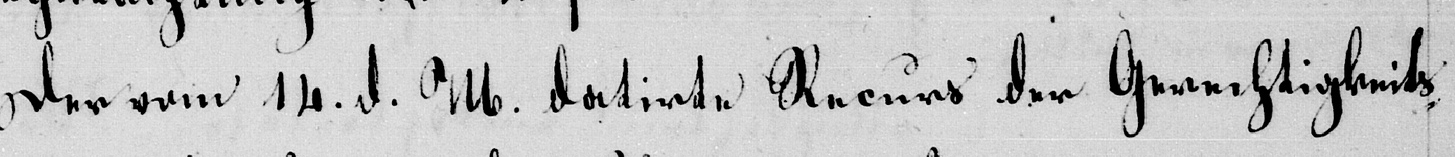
Der vom 14. d. M. datirte Recurs der Gerechtigkeits¬
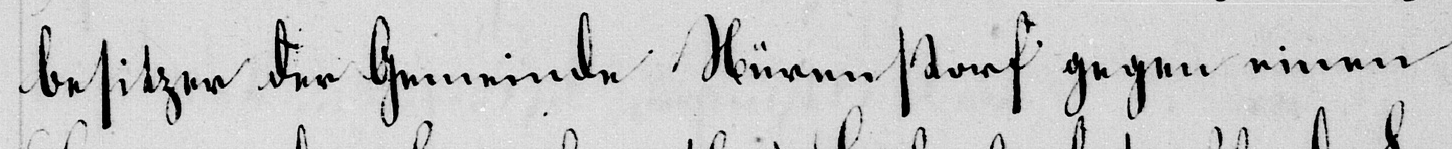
besitzer der Gemeinde Nürenstorf gegen einen
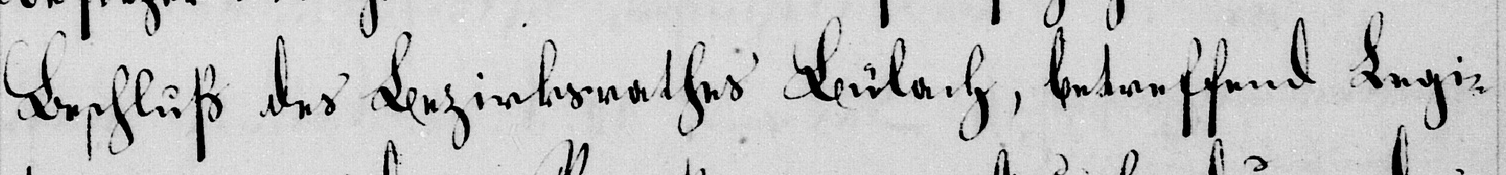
Beschluß des Bezirksrathes Bülach, betreffend Legi¬
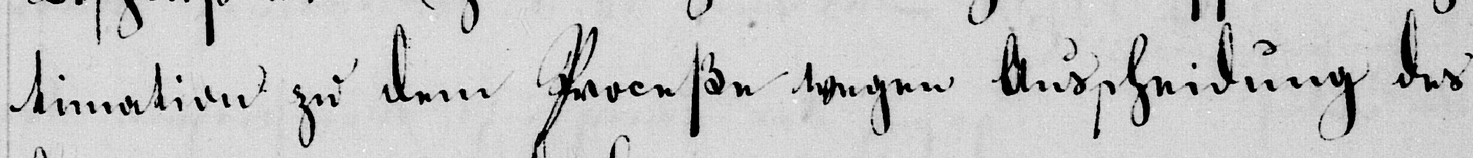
timation zu dem Proceße wegen Ausscheidung des
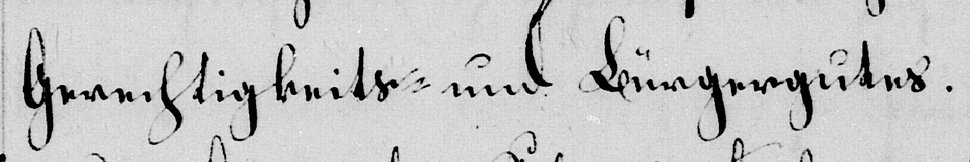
Gerechtigkeits- und Bürgergutes.
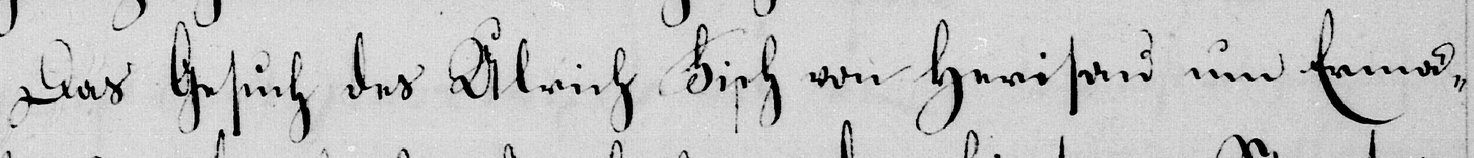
Das Gesuch des Ulrich Fisch von Herisau um Ermä¬
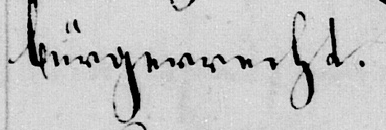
bürgerrecht.
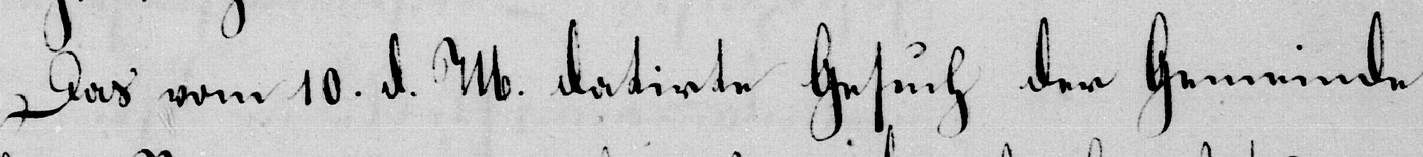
Das vom 10. d. M. datirte Gesuch der Gemeinde
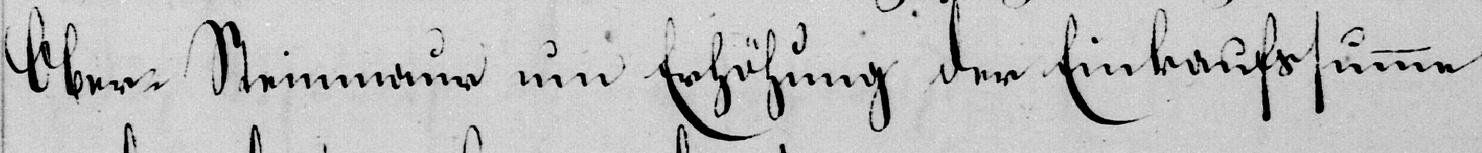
Ober-Steinmaur um Erhöhung der Einkaufssumme
